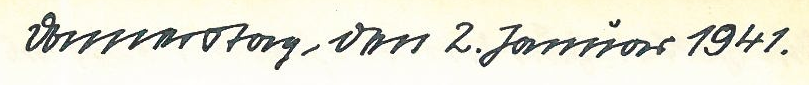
Donnerstag, den 2. Januar 1941.
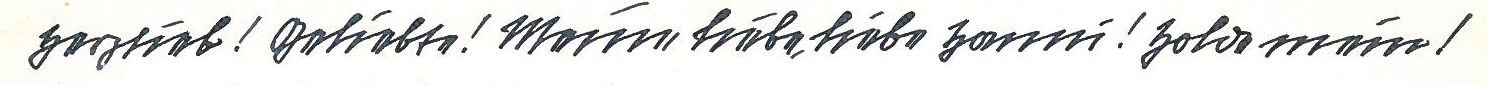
Herzlieb! Geliebte! Meine liebe, liebe! Holde mein!
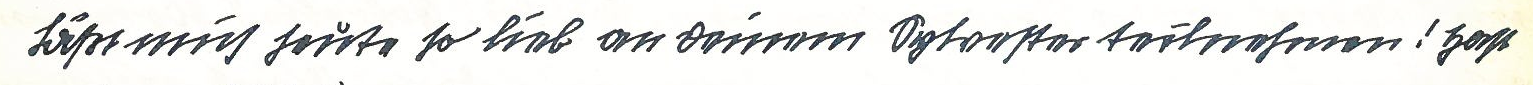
Läßt mich heute so lieb an Deinem Sylvester teilnehmen! Hast
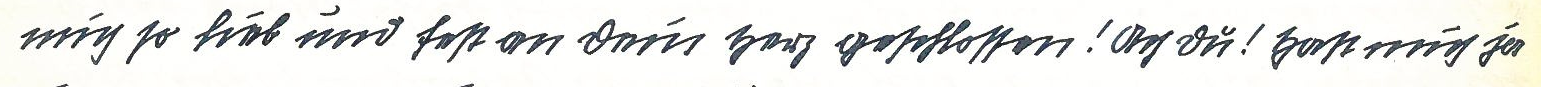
mich so lieb und fest an Dein Herz geschlossen! Ach Du! Hast mich ja
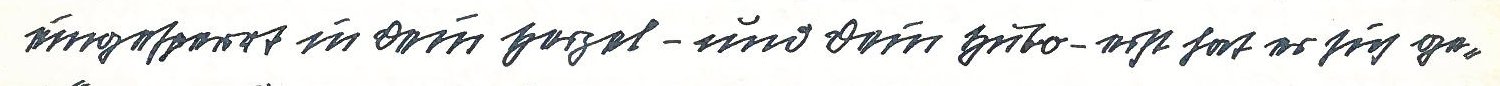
eingesperrt in Dein Herzel – und Dein Hubo – erst hat er sich ge¬
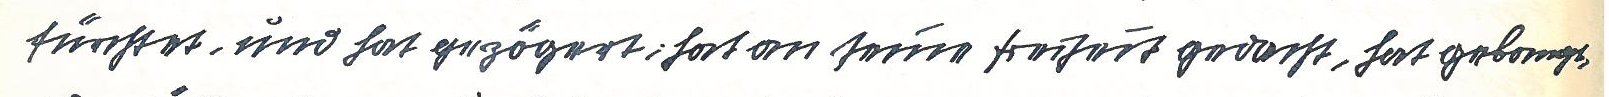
fürchtet, und hat gezögert; hat an seine Freiheit gedacht, hat gebangt,
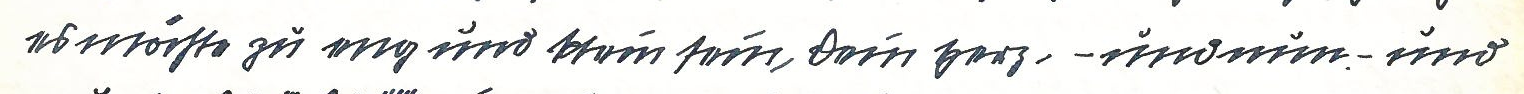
es möchte zu eng und klein sein, Dein Herz, – und nun. – und
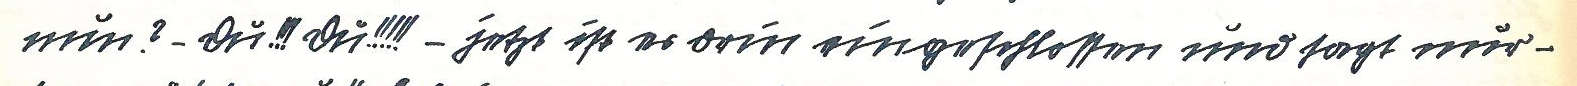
nun? – Du!!! Du!!!!! – jetzt ist er fest eingeschlossen und sagt nur –
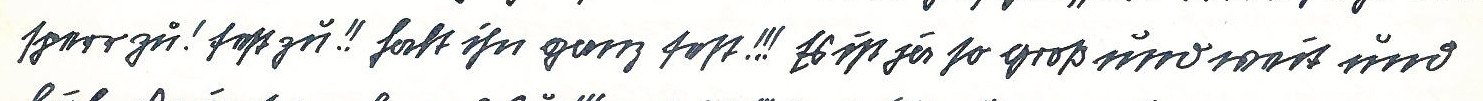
sperr zu! Fest zu!! Halt ihn ganz fest!!! Es ist ja so groß und weit und
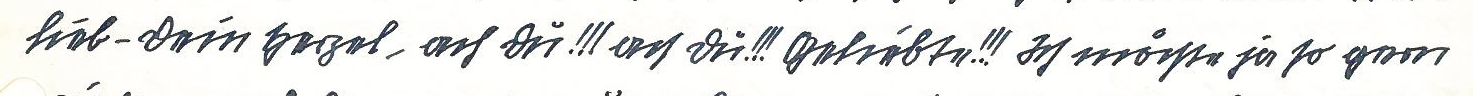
lieb – Dein Herzel, ach Du!!! ach Du!!! Geliebte!!! Ich möchte ja so gern
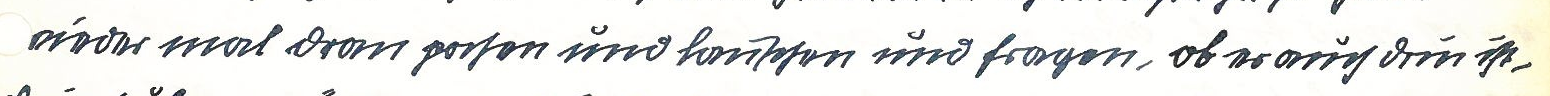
wieder mal dran pochen und lauschen und fragen, ob er auch drin ist,
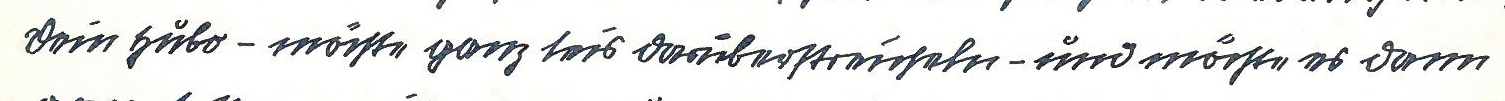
Dein Hubo – möchte ganz leis darüberstreicheln – und möchte es dann
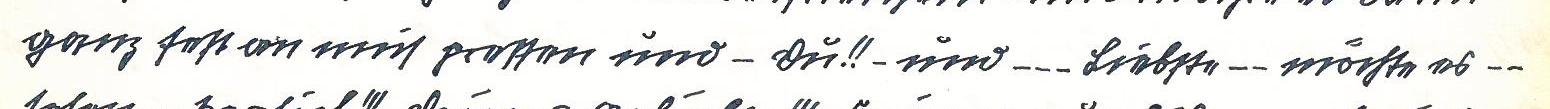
ganz fest an mich pressen und – Du!! – und – – – Liebste – – möchte es – –
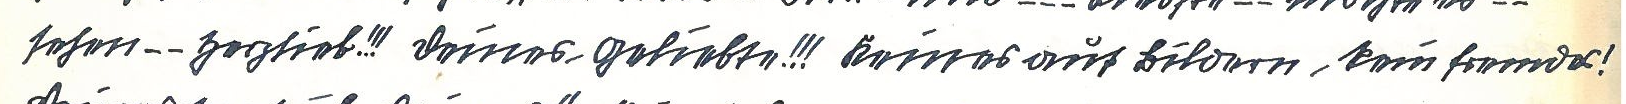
sehen – – Herzlieb!!! Deines, Geliebte!!! Keines auf Bildern, kein Fremdes!
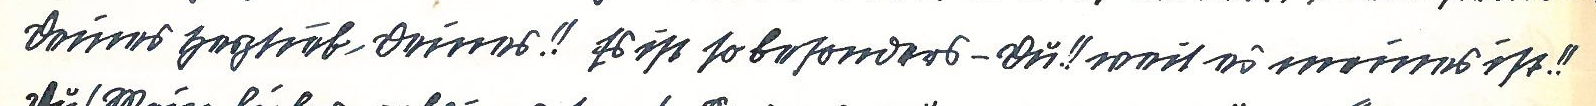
Deines Herzlieb, Deines!! Es ist so besonders – Du!! weil es meines ist!!
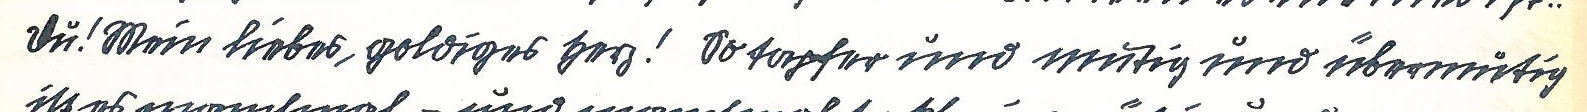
Du!! Mein liebes, goldiges Herz! So tapfer und mutig und übermütig
